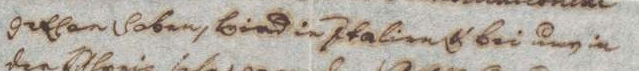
gethan haben, wird in Italien & bei uns in
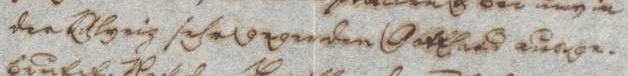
der Schweiz sehr gegen den Gotthard ausge-
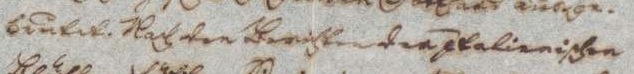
beutet. Nach den Berichten der Italienischen
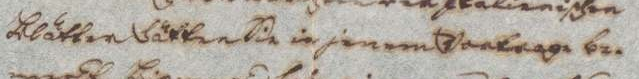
Blätter hätten Sie in jenem Vortrage be-
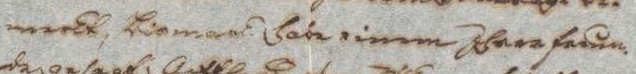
merkt, Bismark habe einem Ihrer Freun-
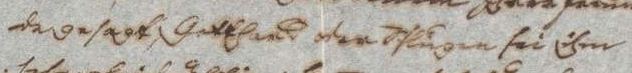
de gesagt, Gotthard oder Splügen sei ihm
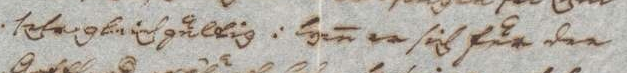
sehr gleichgültig; wenn er sich für den
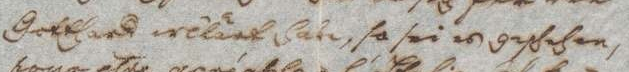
Gotthard erklärt habe, so sei es geschehen,
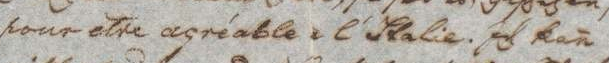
pour etre agréable à l'Italie. Ich kann
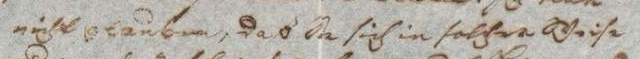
nicht glauben, daß Sie sich in solcher Weise
